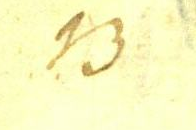13
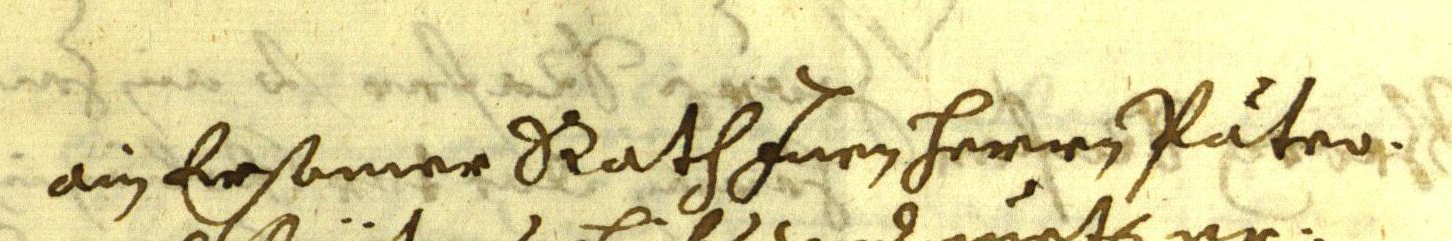ain Ersamer Rath Inen herrn Pāter.
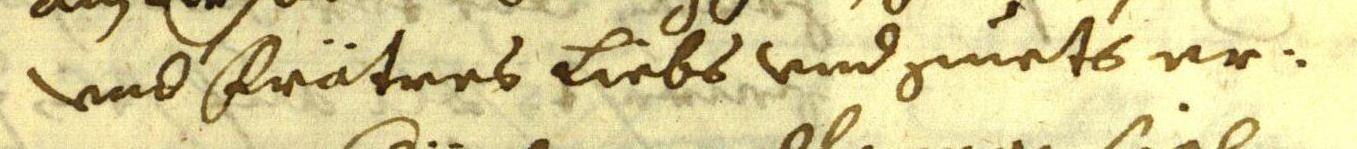vnd Fräters Liebs vnd gūets er¬
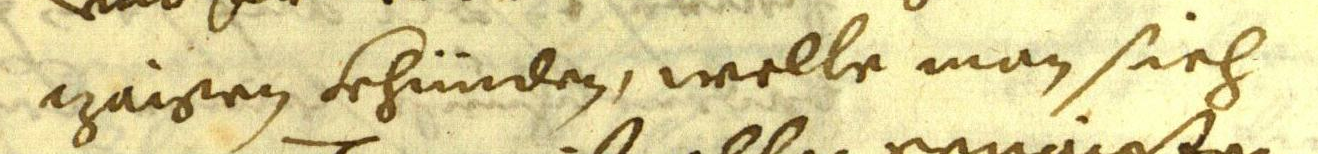zaigen khünden, welle man sich
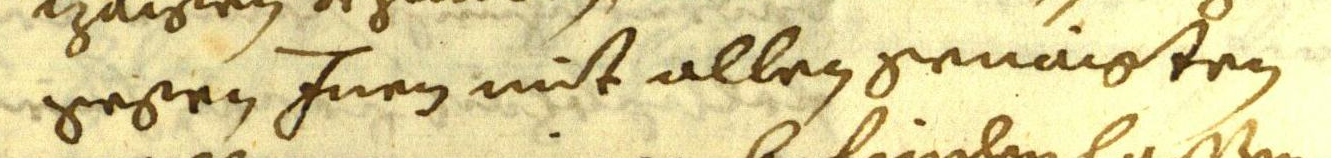gegen Inen mit allen genaigsten
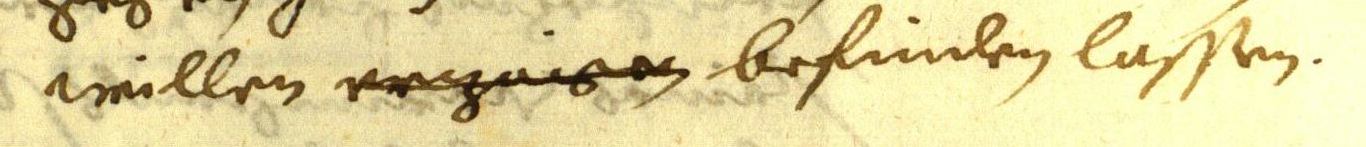willen erzaigen befinden lassen.
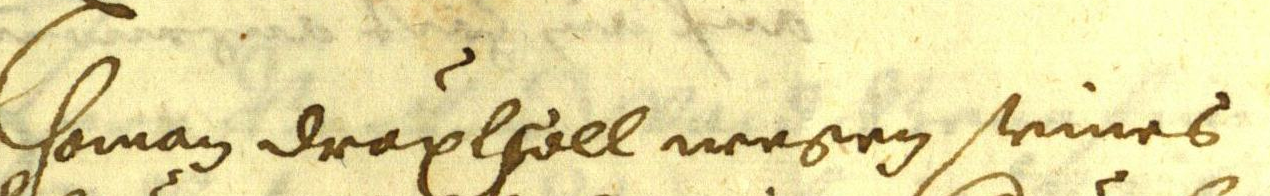Thoman drāxl soll wegen seines
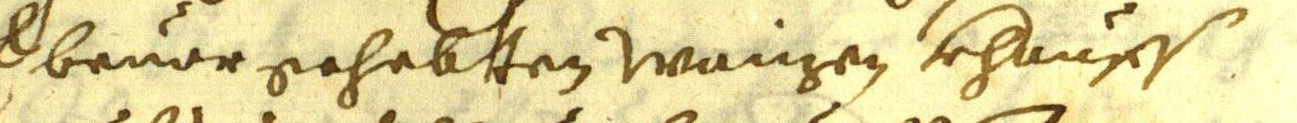beūor gehabten Waizen khaūfs
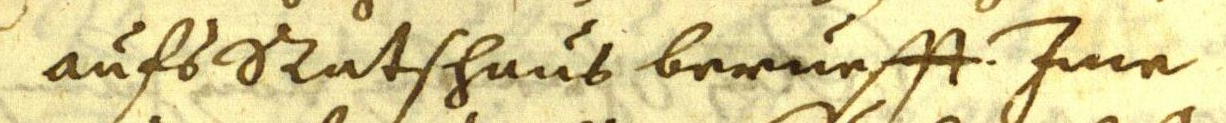aūfs Rathaūs berūefft. Ime
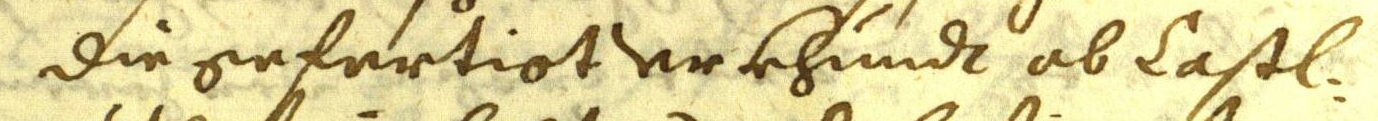die gefertigt vrkhūndt ob Castl¬
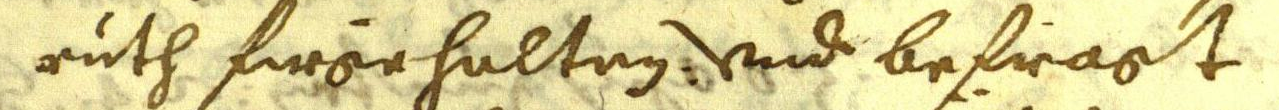rūth firgehalten. vnd befragt
